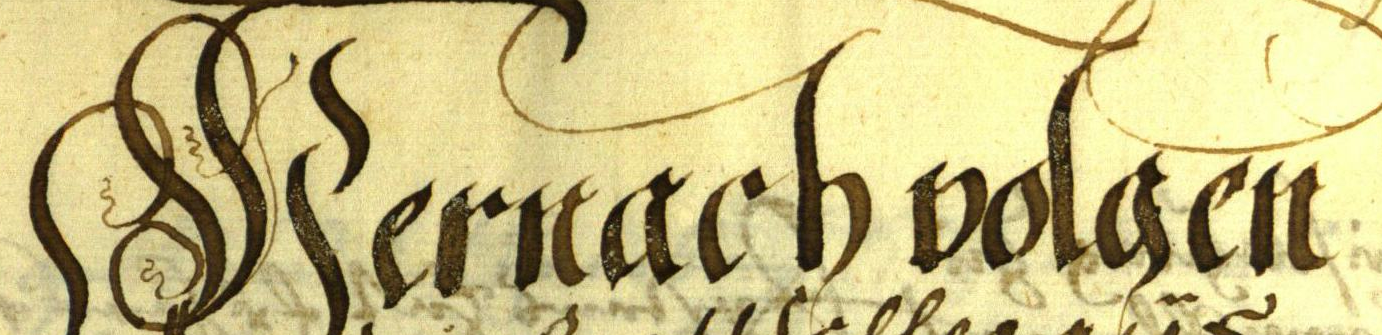Hernach volgen
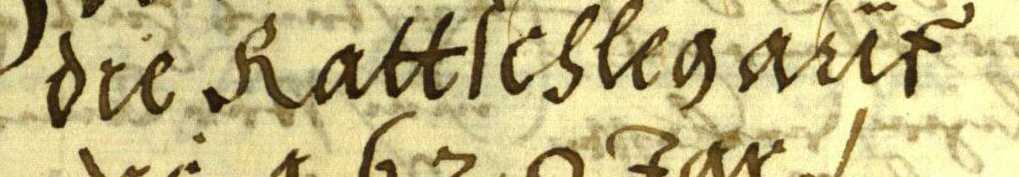die Rattschleg aüf
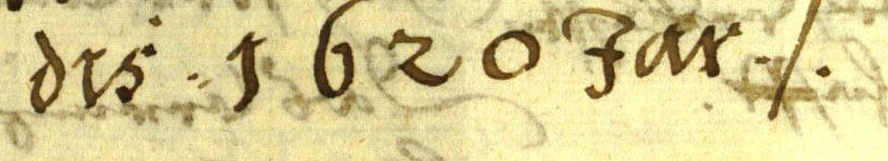dis: 1620 Jar./.
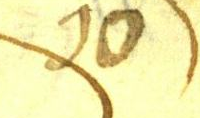10
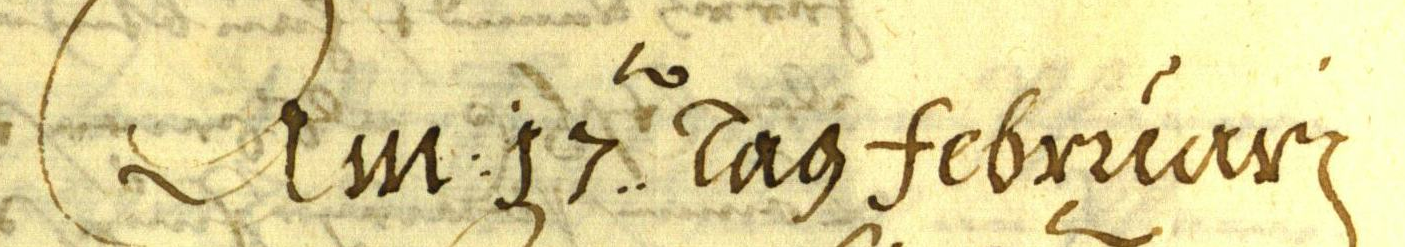Am: 17t.. Tag Febrūarj
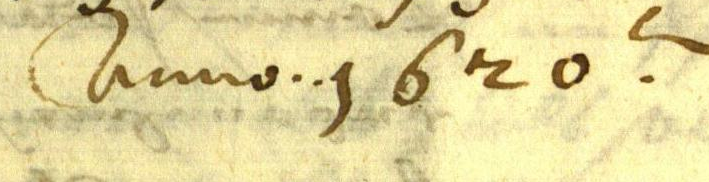Anno: 1620t.
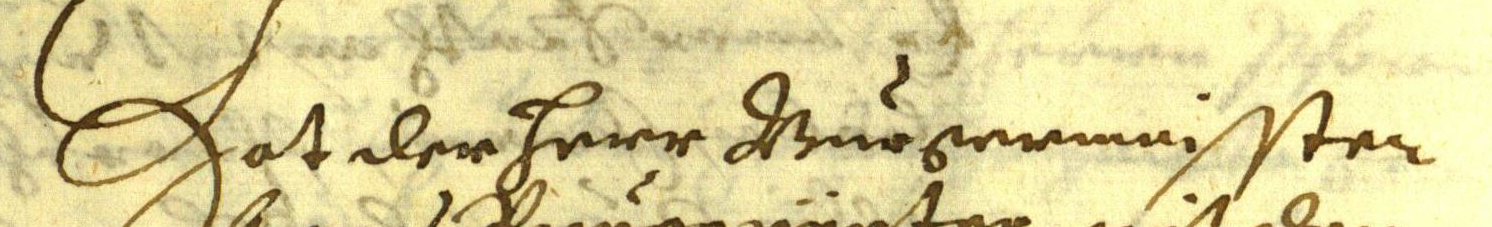Hat der herr Būrgermaisster
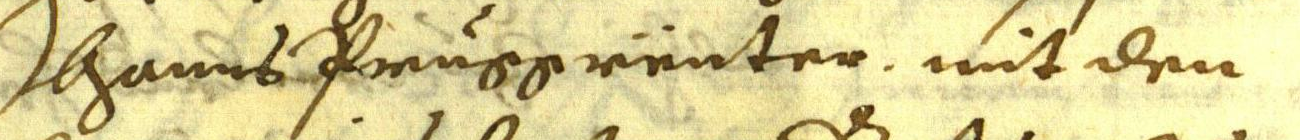Hanns Prūggreüter. mit den
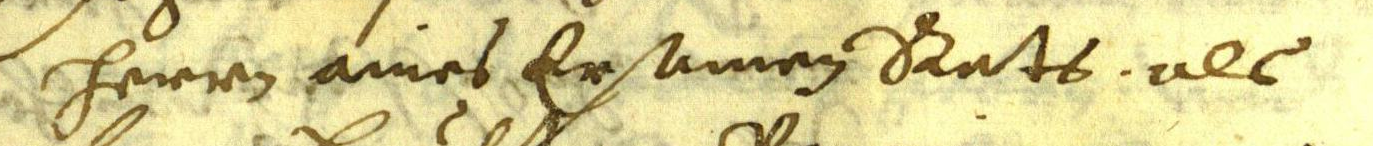herrn aines Ersamen Rats. als
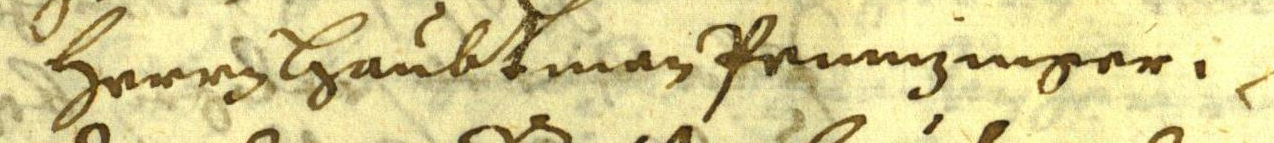Herrn Haūbtman Pennzinger,
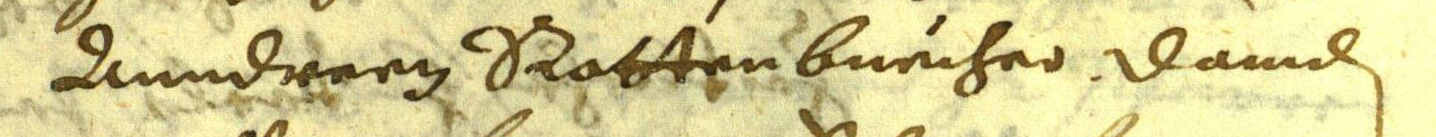Anndreen Rottenbūecher. Daūid
